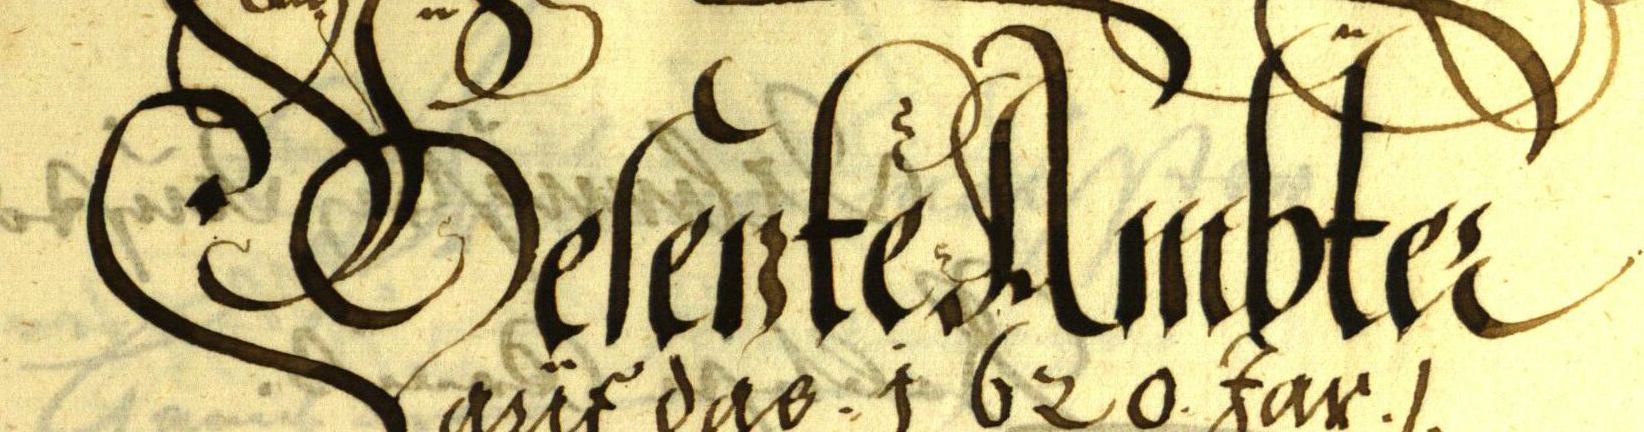Belegte Ambter
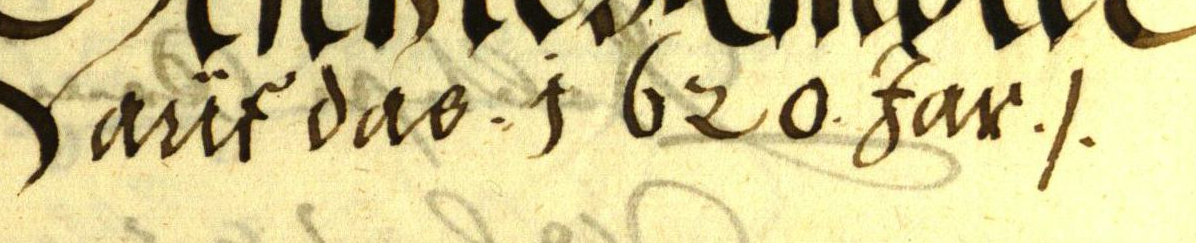aüf das .1620. Jar./.
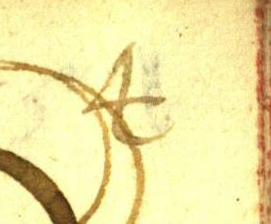4
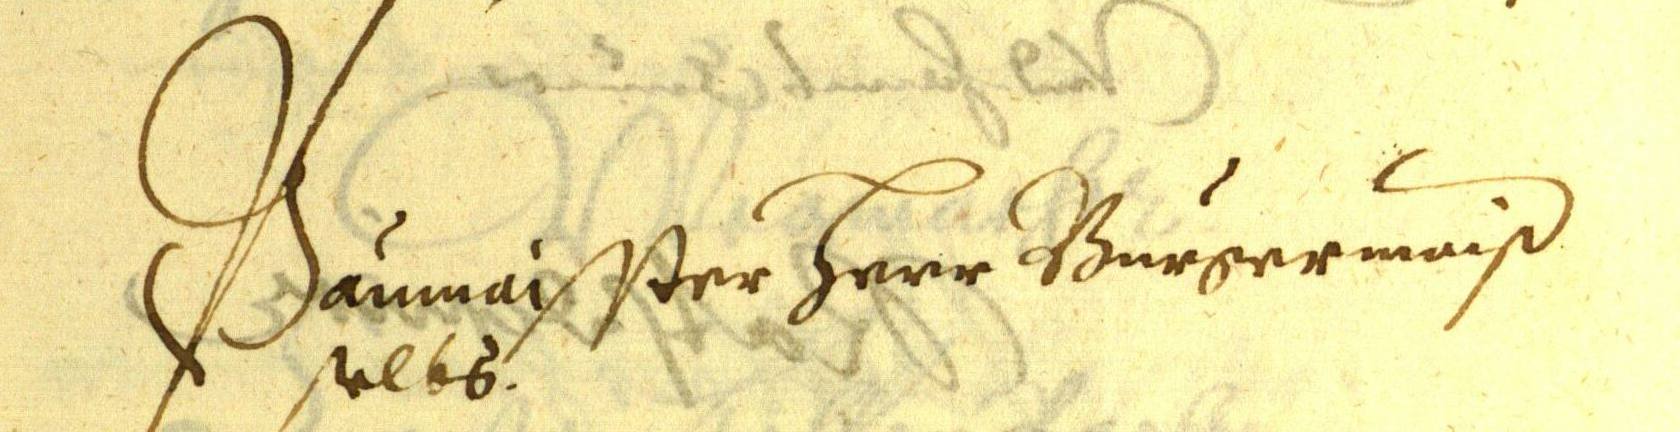Paūmaister Herr Būrgermaist
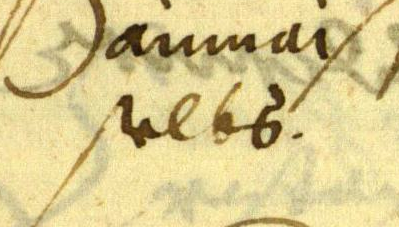selbs.
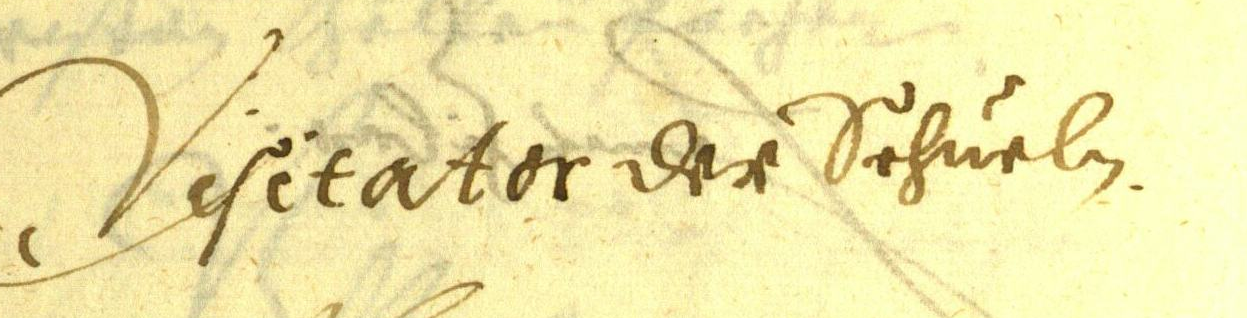Visitator der Schūeln.
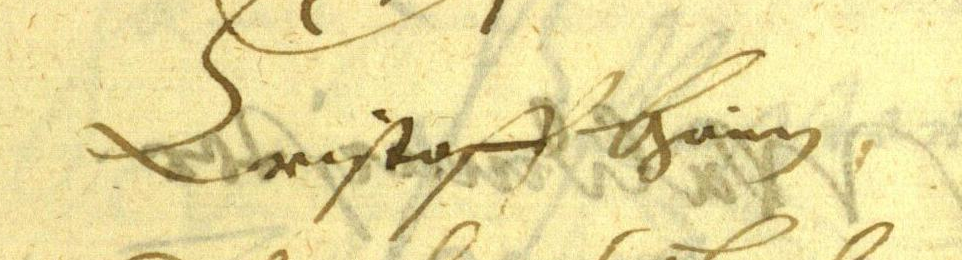Cristoff Haim
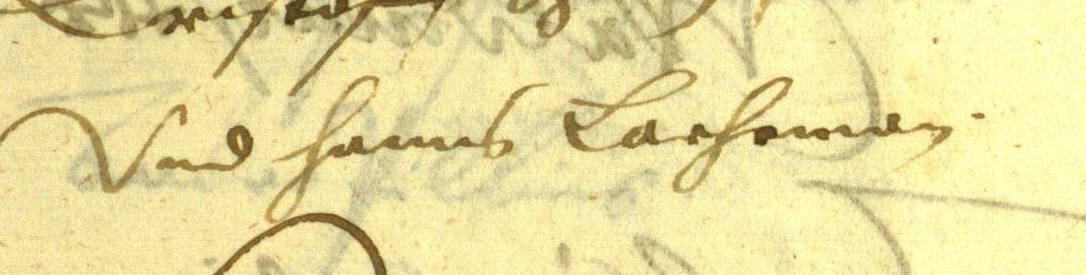Vnd hanns Lacheman
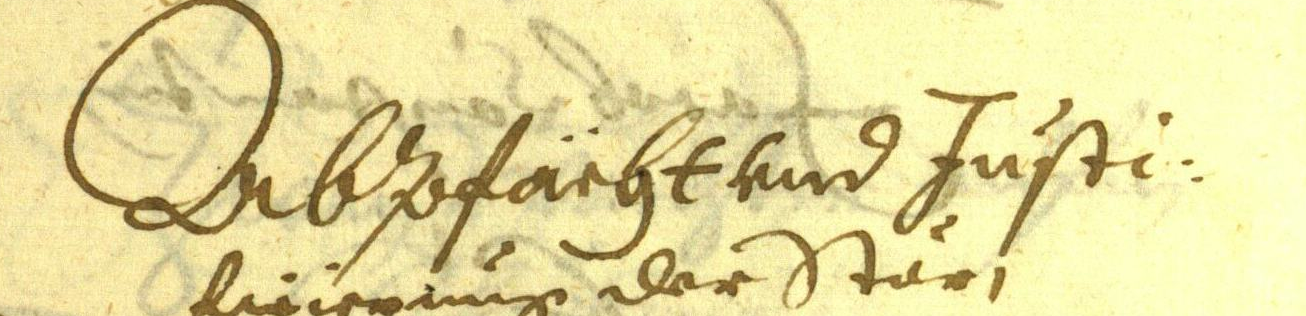AbPfächt vnd Jūsti¬
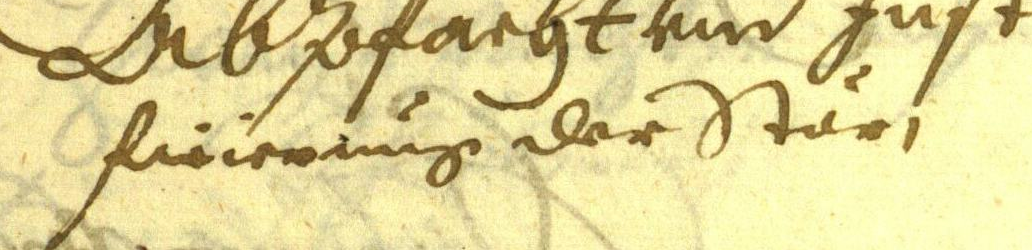ficierūng der Stār,
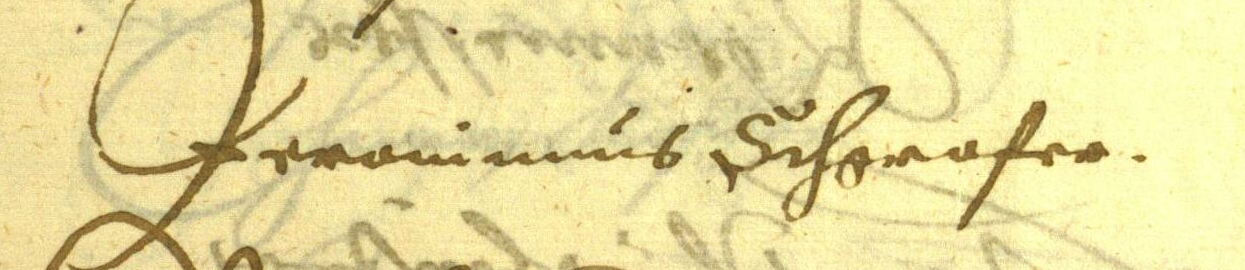Jeronimūs Schgrafer.
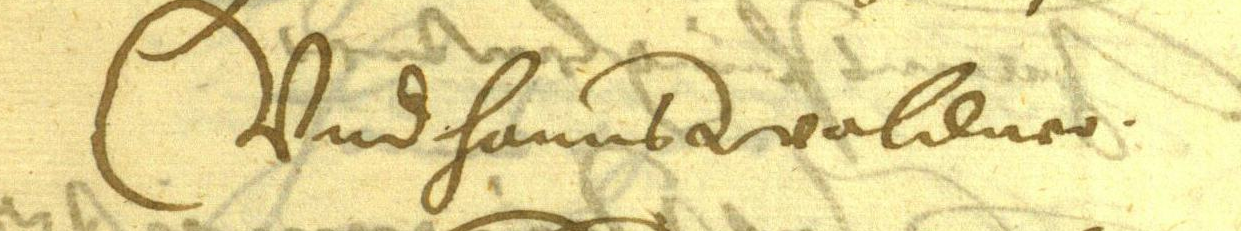Vnd Hanns Waldner.
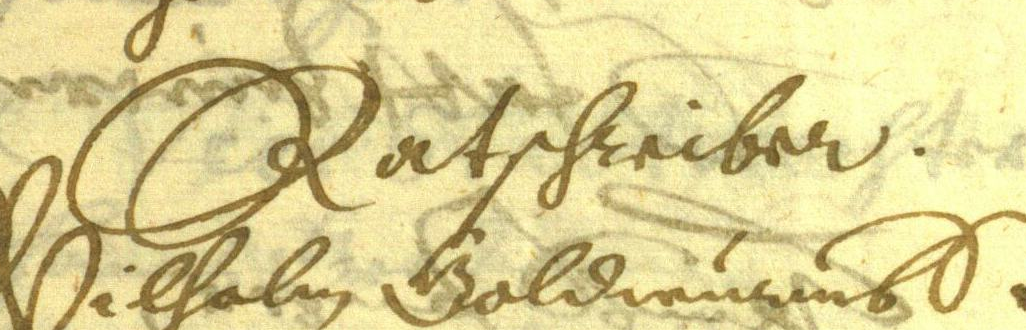Ratschreiber.
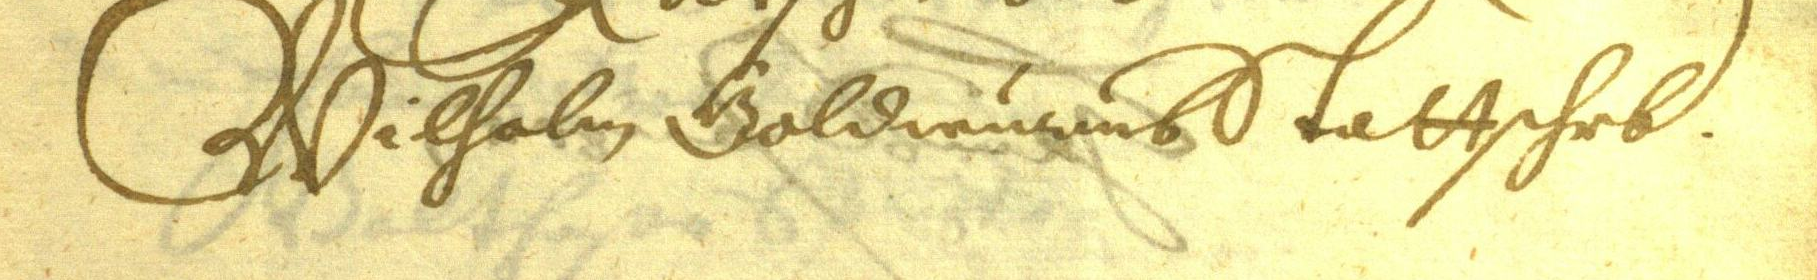Wilhalm Goldwūrmb Stattschrb.
